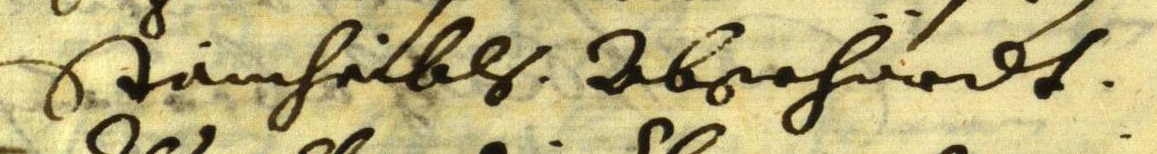Stainheibls. Abgehördt.
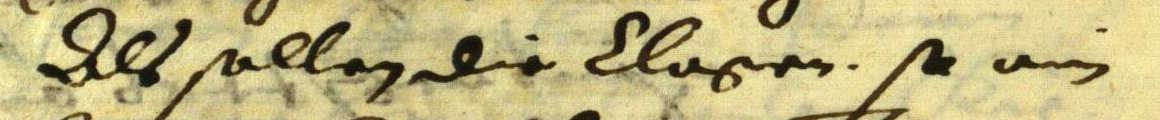Als sollen die Clagen. so ain
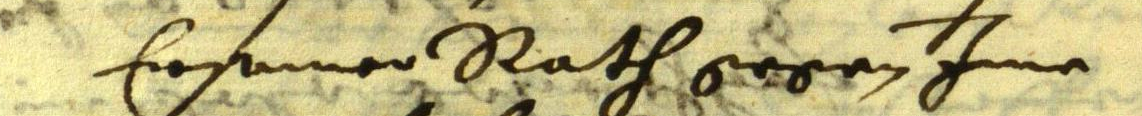Ersamer Rath gegen Ime
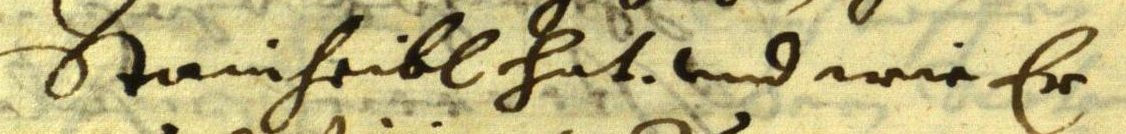Stainheibl hat. vnd wie Er
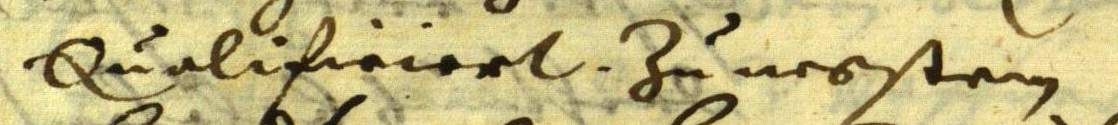Qūalificiert. Zū negstem
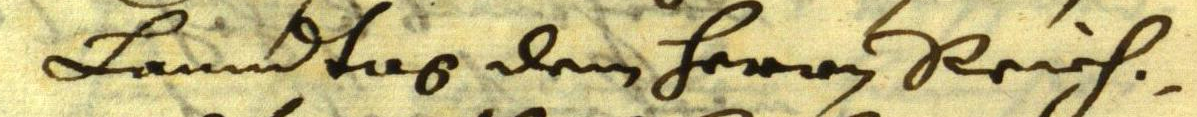Lanndtag dem herrn Reich¬
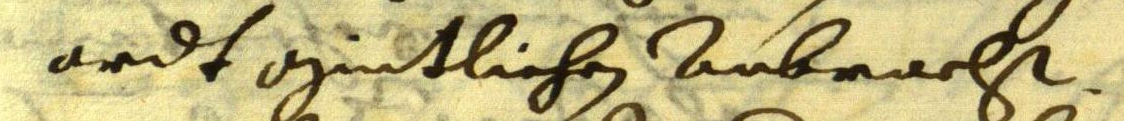ardt mintlichen Anbracht.
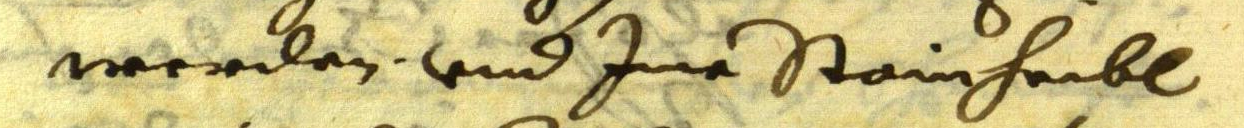werden. vnd Ime Stainheibl
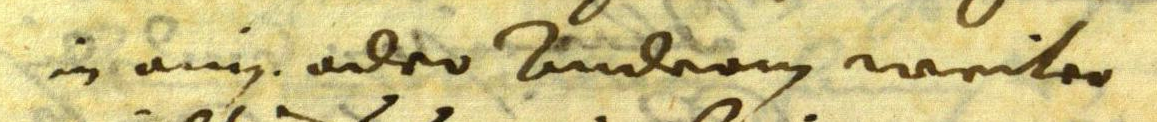in aim. oder Andern weiter
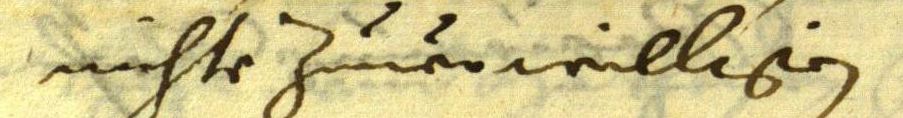nichte Zūūerwilligen
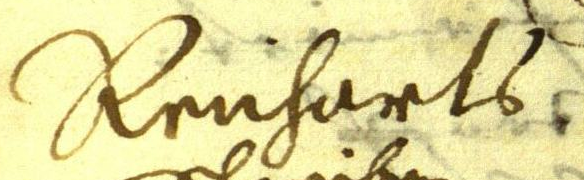Reicharts
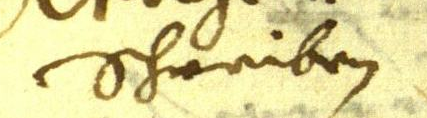Schreiben
